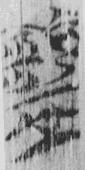○（盥）
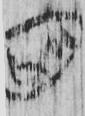名（銘）
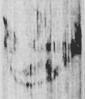曰
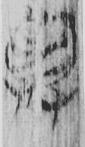與
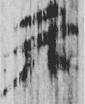亓（其）
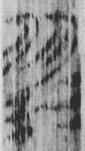溺
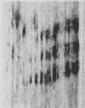於
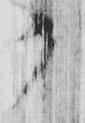人
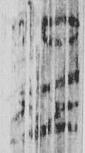寍
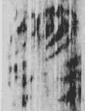溺
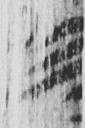於
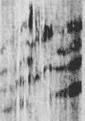○（淵）
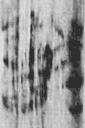猶
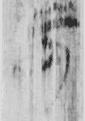可
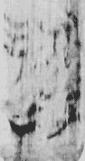游
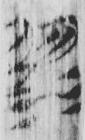溺
